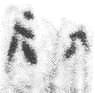君
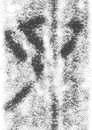子
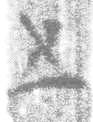之
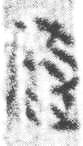道
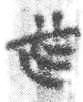必
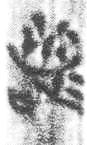若
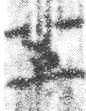五
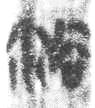浴
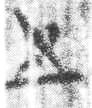之
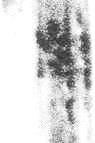尃
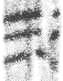三
